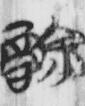○（舒）
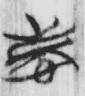慶
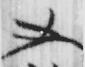之
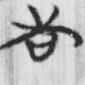告
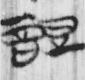○（屬）
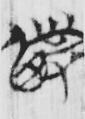○（僕）
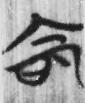命
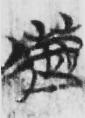速
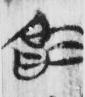爲
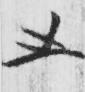之
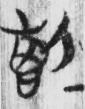斷
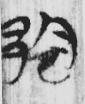陰
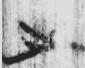之
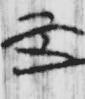正
